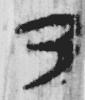乃
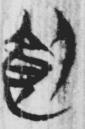飤（食）
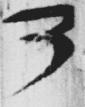乃
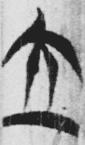立
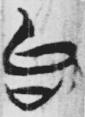句（后）
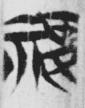禝（稷）
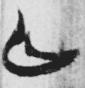㠯（以）
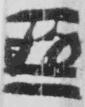爲
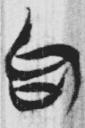句（后）
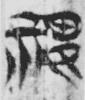禝（稷）
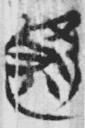既
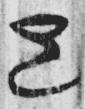已
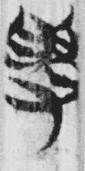受
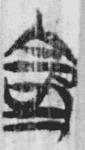命
